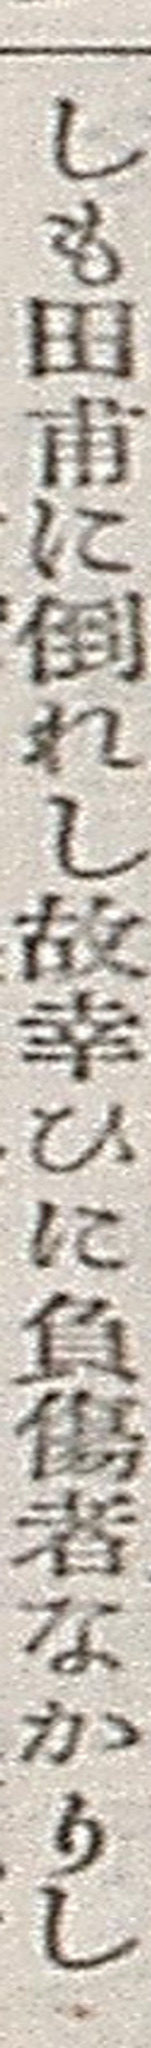しも田甫に倒れし故幸ひに負傷者なかりし
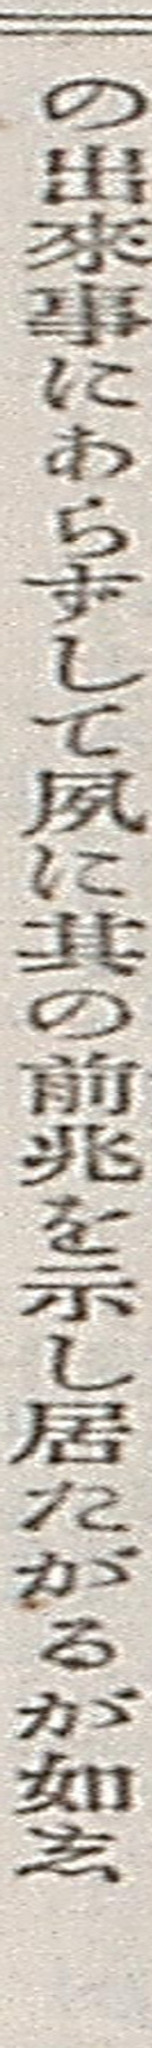の出来事にあらずして夙に其の前兆を示し居たがるが如也
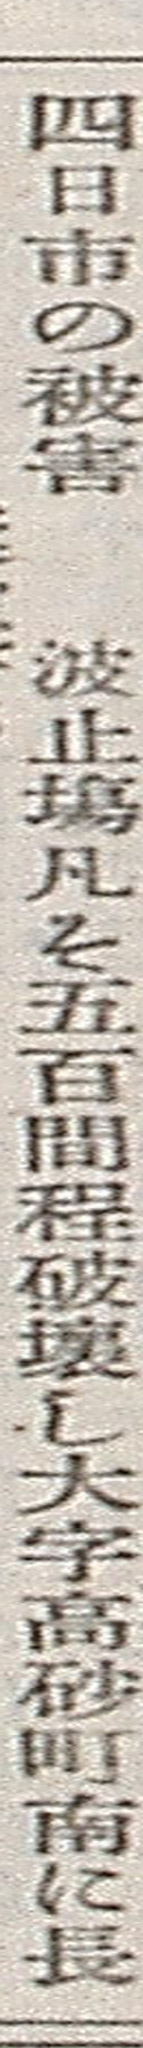四日市の被害波止場凡そ五百間程破壊し大字高砂町南に長
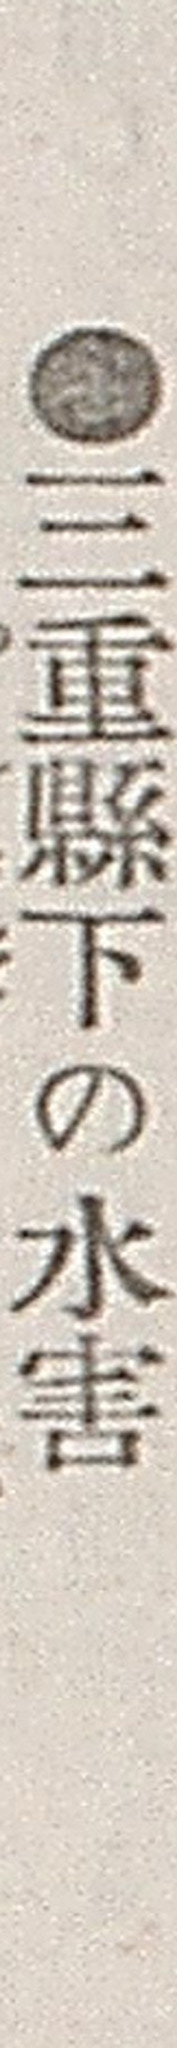●三重県下の水害
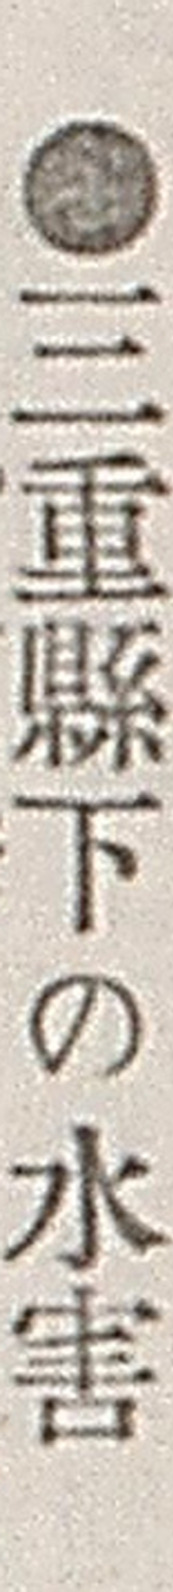●三重県下の水害
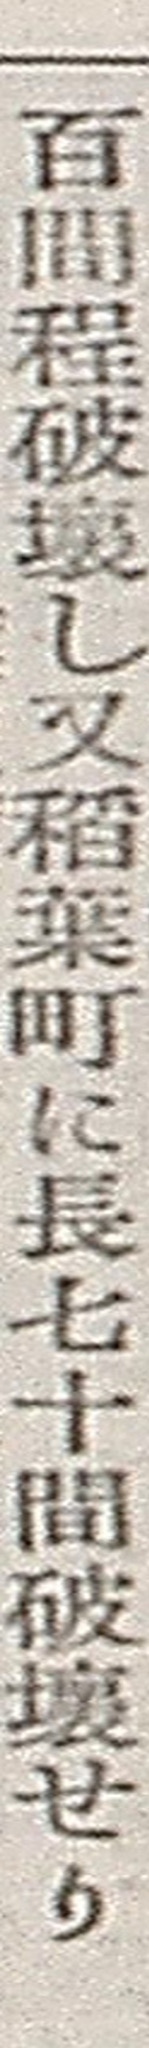百間程破壊し又稲葉町に長七十間破壊せり
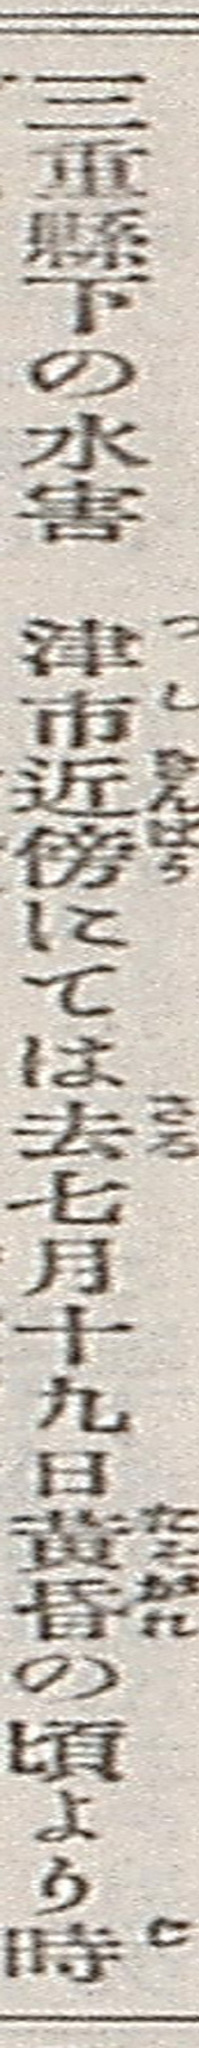三重県下の水害津市近傍にては去七月十九日黄昏の頃より時
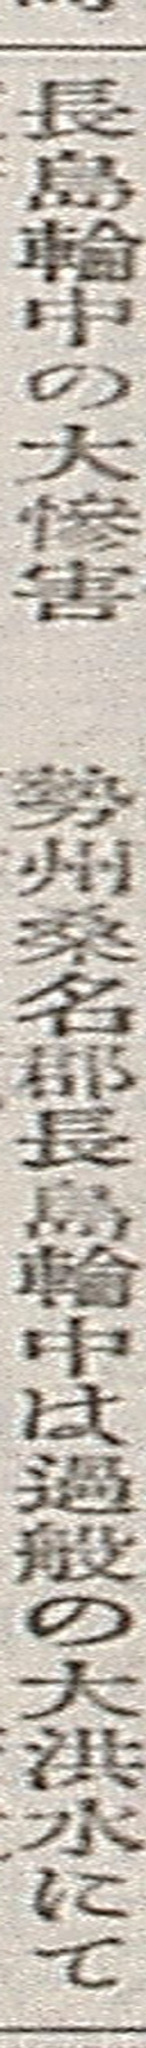長島輪中の大惨害勢州桑名郡長島輪中は過般の大洪水にて
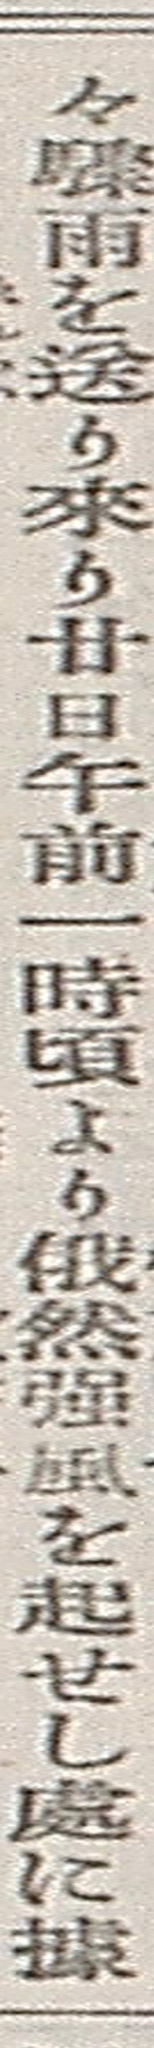々驟雨を送り来り廿日午前一時頃より俄然強風を起せし処に據
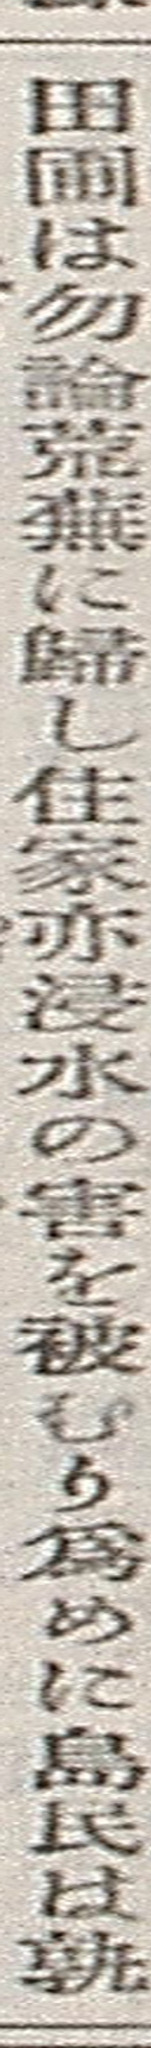田園は勿論荒蕪に帰し住家亦浸水の害を被むり為めに島民は孰
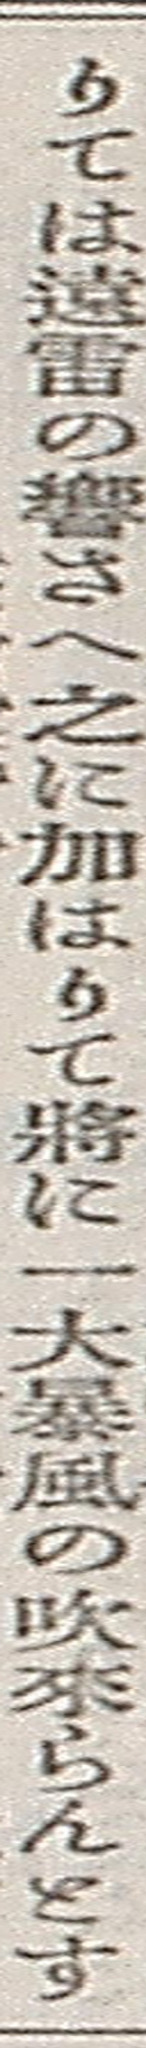りては遠雷の響さへ之に加はりて将に一大暴風の吹来らんとす
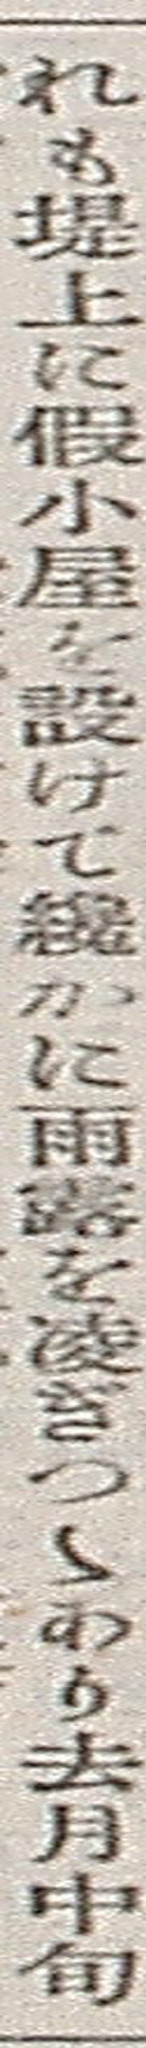れも堤上に假小屋を設けて纔かに雨露を凌ぎつゝあり去月中旬
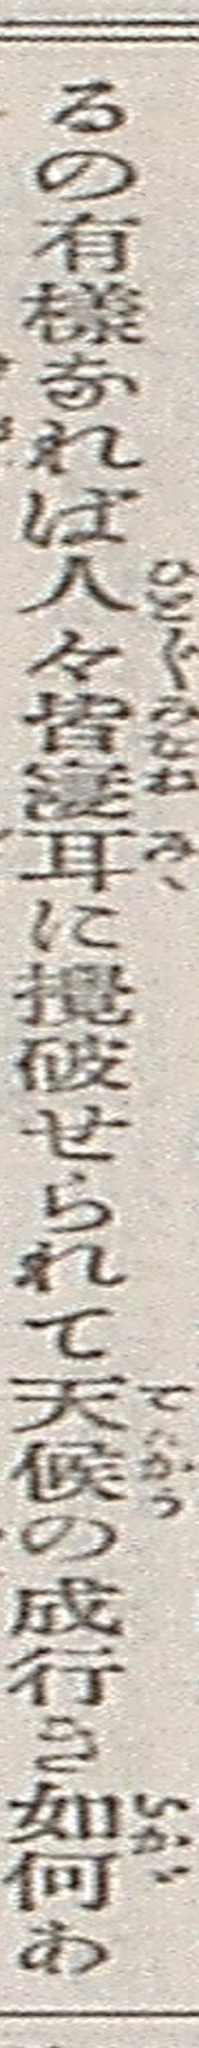るの有様なれば人々皆寝耳に攪破せられて天候の成行き如何あ
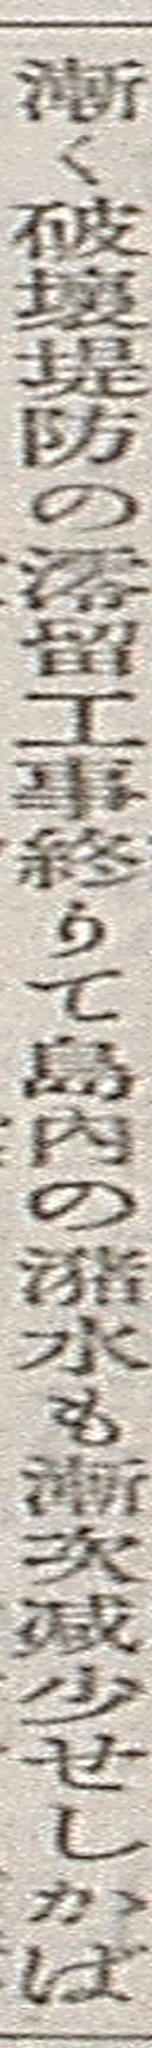漸く破壊堤防の澪留小路終りて島内の瀦水も漸次減少せしかば
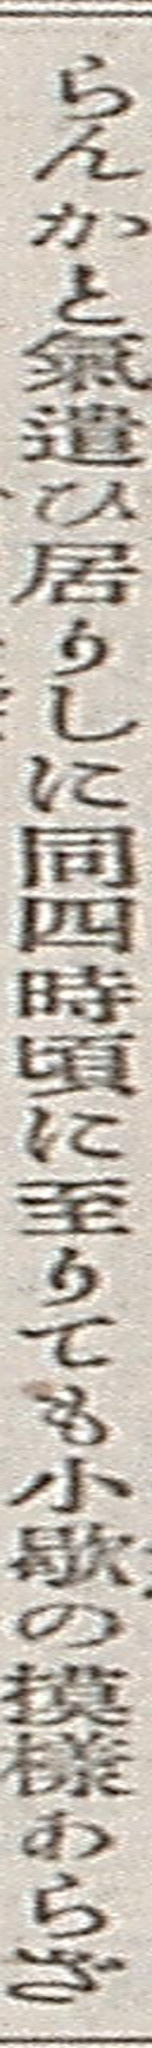らんかと気遣ひ居りしに同四時頃に至りても小歇の模様あらざ
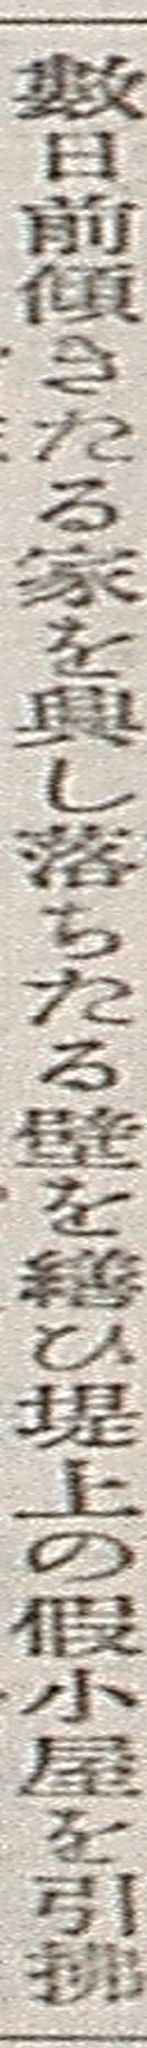数日前傾きたる家を興し落ちたる壁を繕ひ堤上の仮小屋を引払
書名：風俗畫報臨時増刊第百二十八號　洪水被害録（下）
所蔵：東京大学地震研究所図書室 Earthquake Research Institute Library, The University of Tokyo, JAPAN
